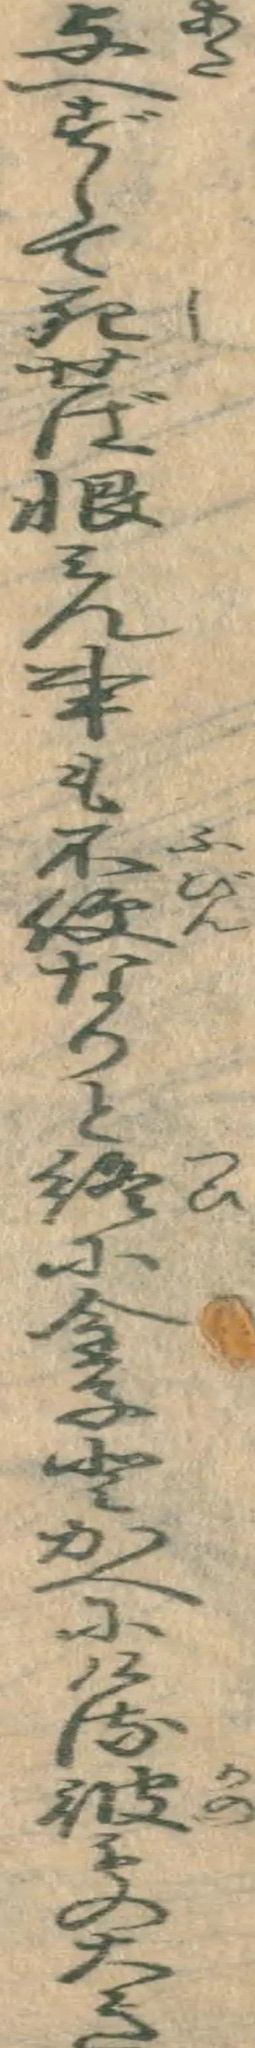与へずして死せば恨みん事も不便なりと終に金子とかへにける彼もの大き
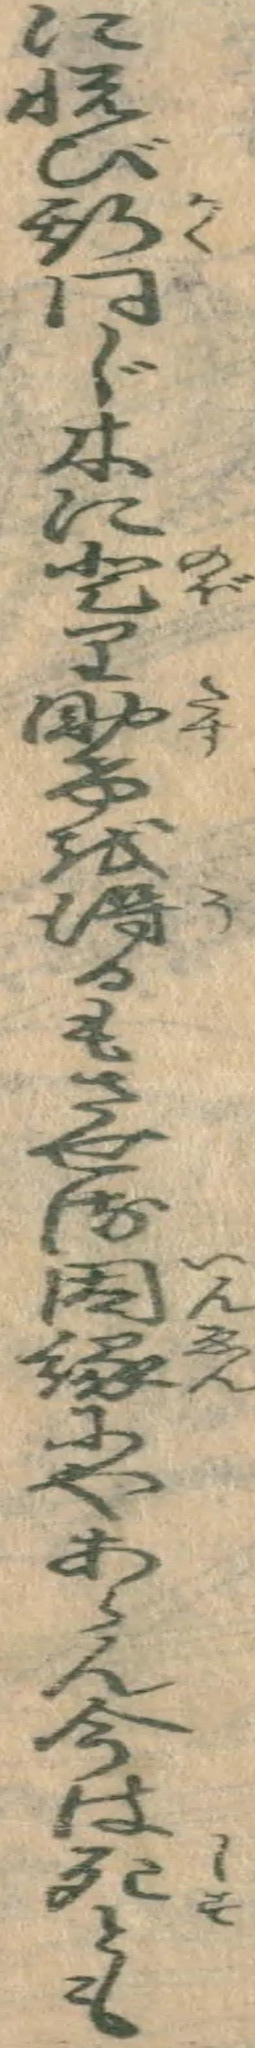に悦び斯同じ木に登り助けを得るもさせる因縁にやあらん今は死とも
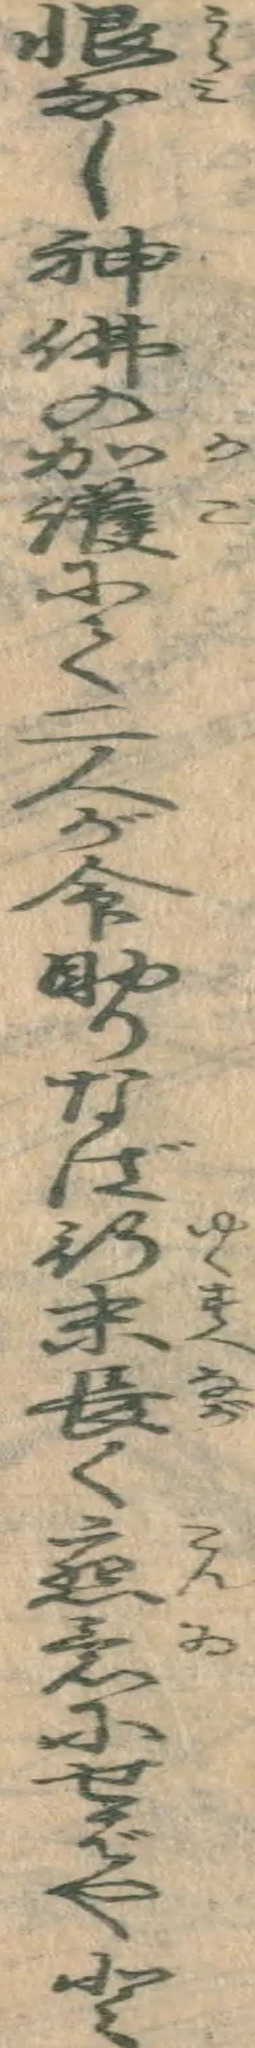恨なし神仏の加護にて二人が命助りなば行末長く懇意にせばやと
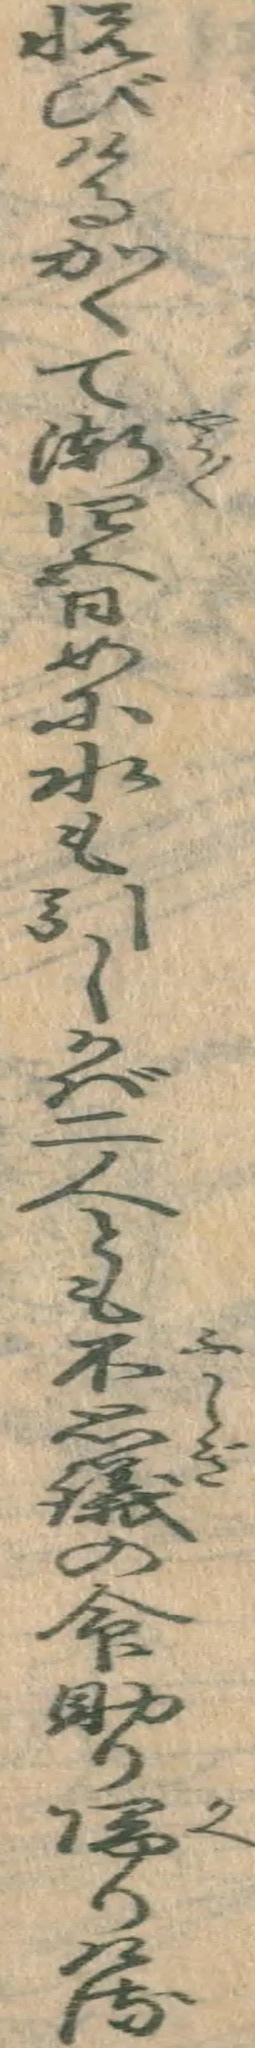悦びけるかくて漸四五日めに水も引しかば二人とも不思議の命助り帰りける
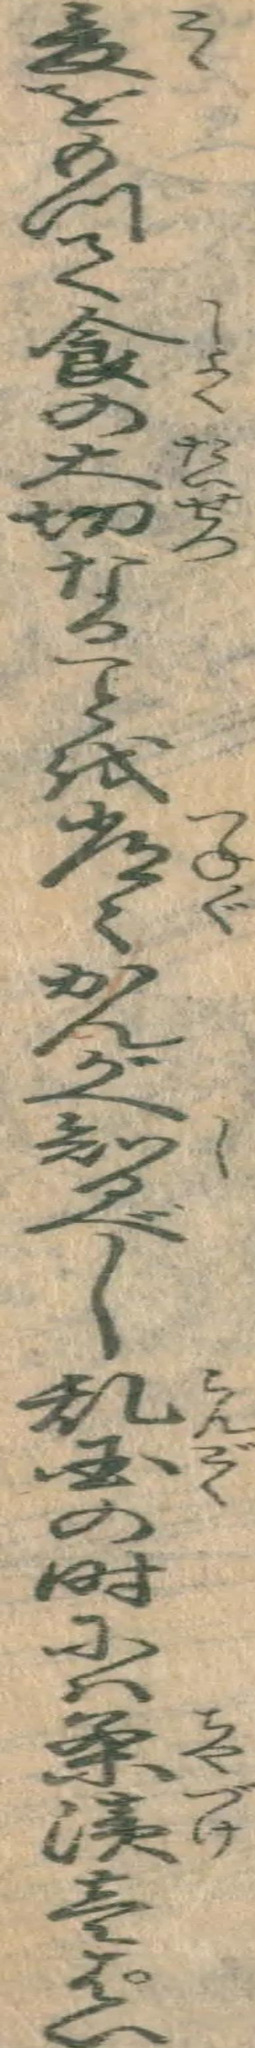爰をもって食の大切なることを常々かんがへ知るべし乱国の時には茶漬壱ぱい
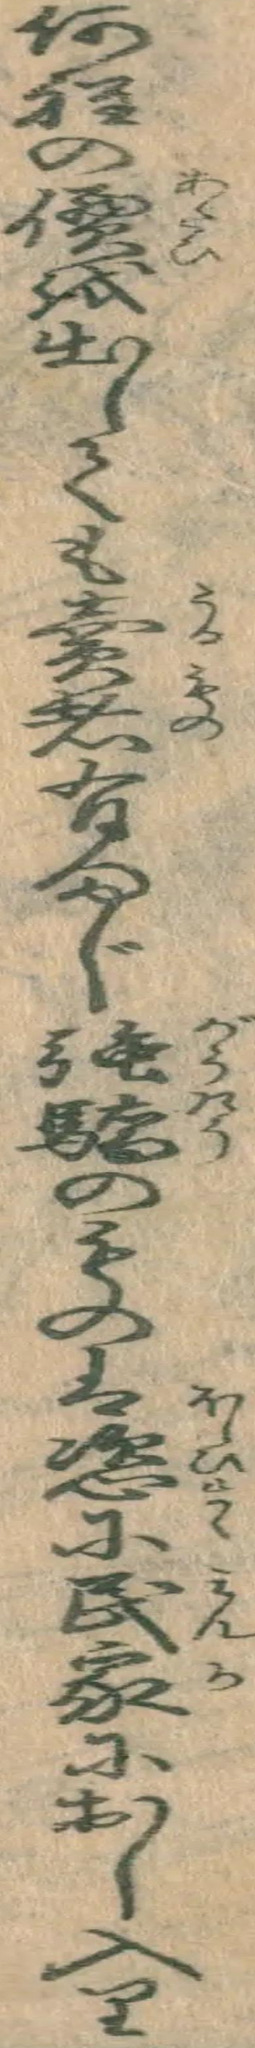何程の価を出しても売者有まじ強驕のものは恣に民家におし入り
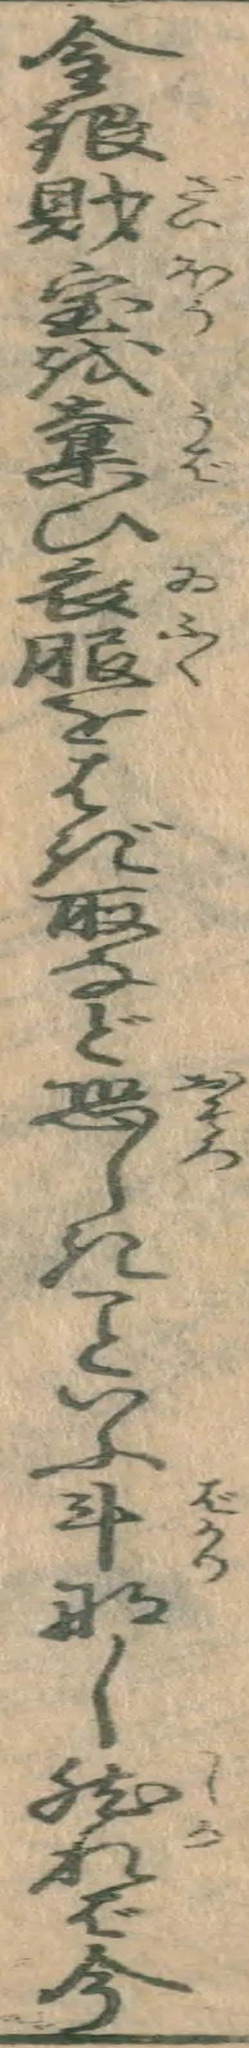金銀財宝を奪ひ衣服をはぎ取など恐しきこといふ斗なし然れば今
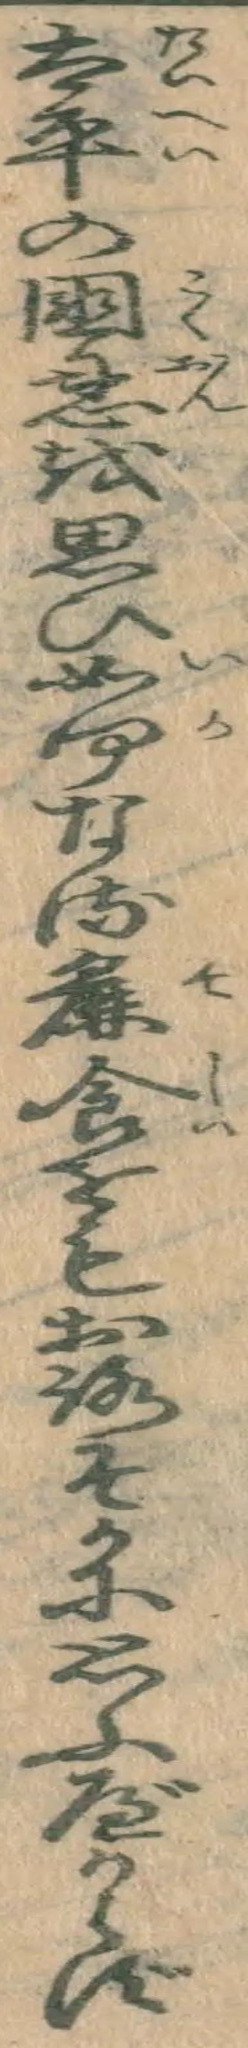太平の国恩を思ひ如何なる麁食をもおろそかに思ふべからず
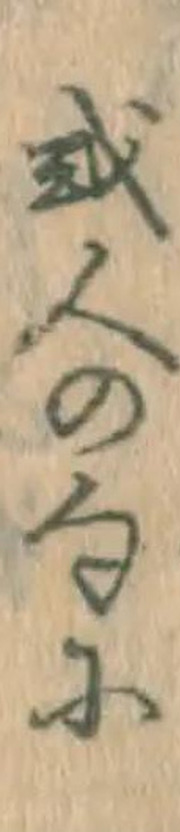或人の句に
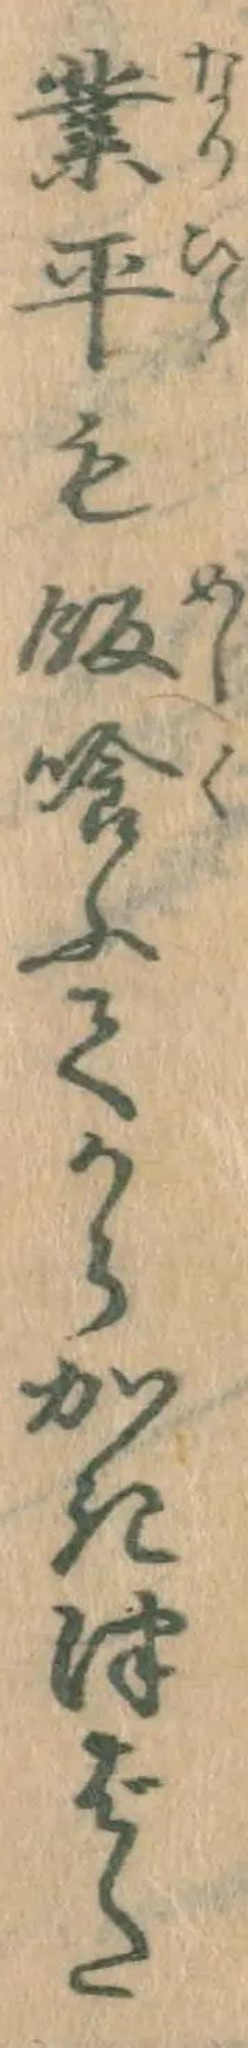業平も飯喰ふてからかきつばた
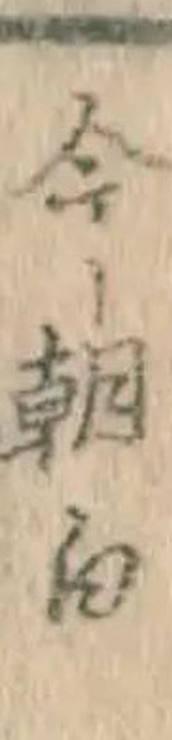今-朝白
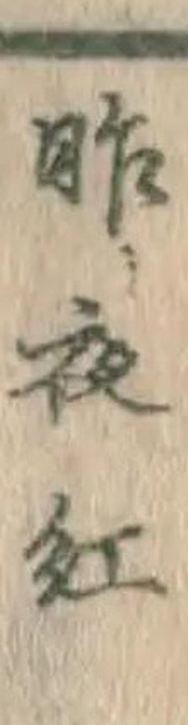昨-夜紅
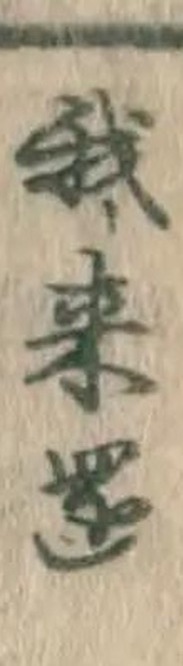我-来還

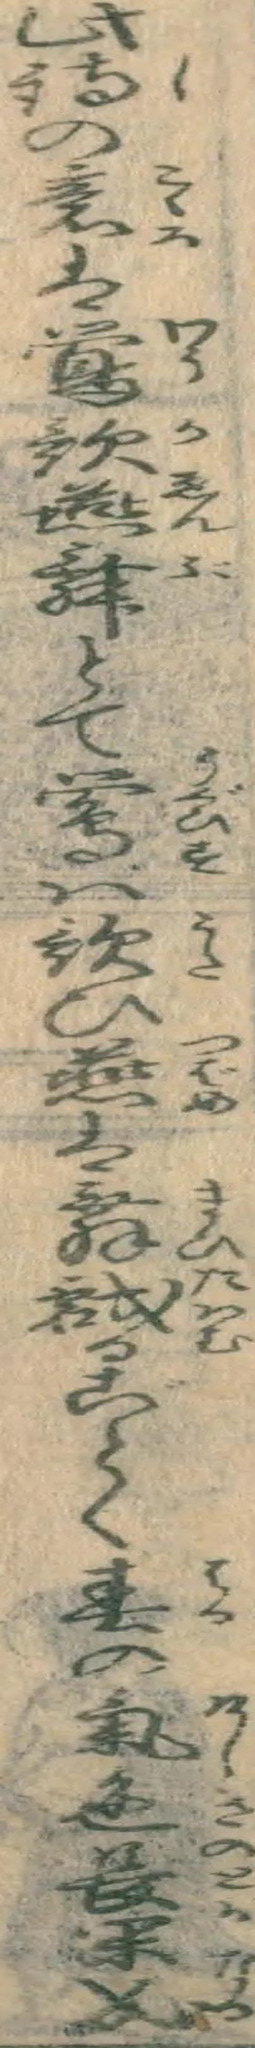此詩の意は鶯歌燕舞とて鶯は歌ひ燕は舞戯るごとく春の気色長閑成
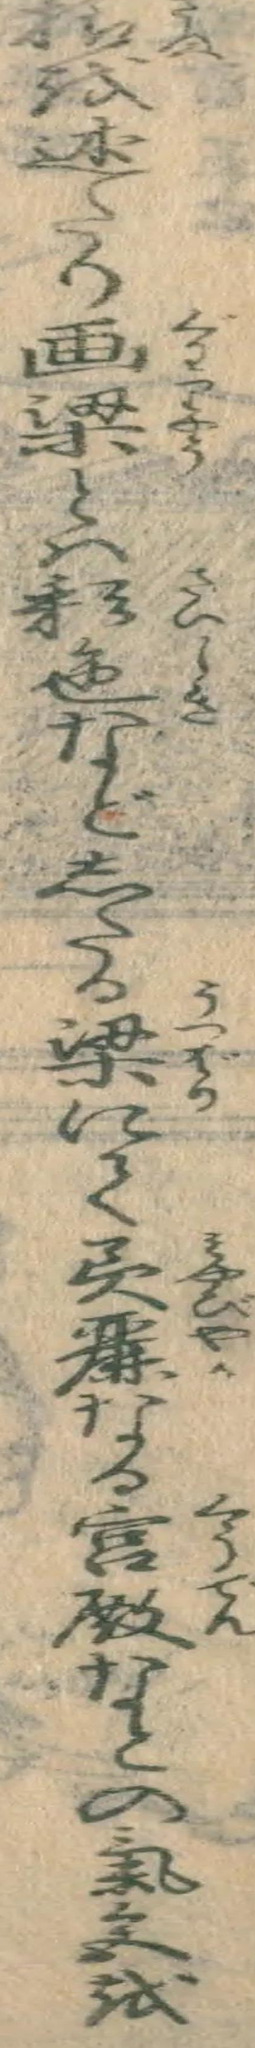様を述たり画梁とは彩色などしたる梁にて美麗なる宮殿なとの気色を
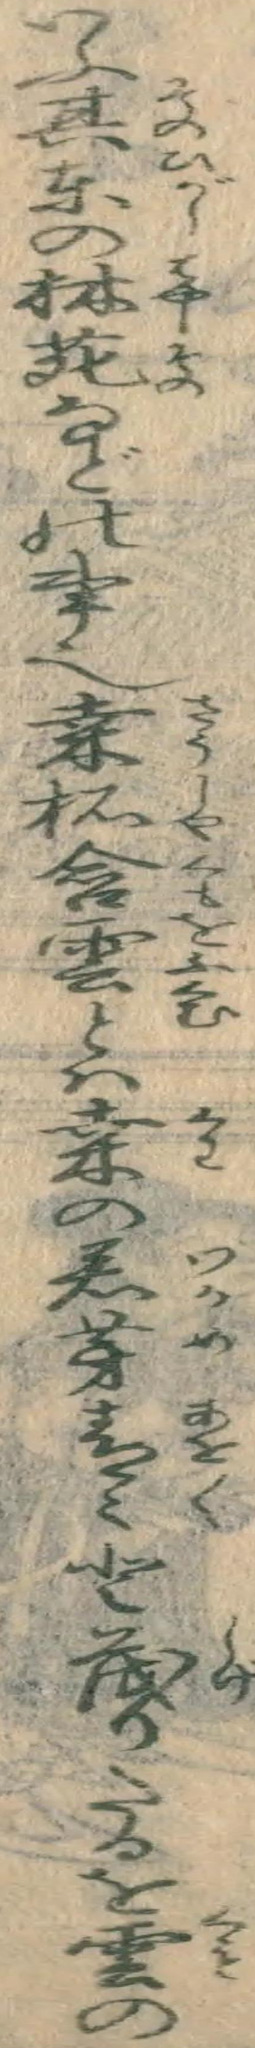いふ其東の林苑などの事也桑拓含雲とは桑の若芽青々と茂りたるを雲の
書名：養蚕秘録 3巻. [3]
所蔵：国立国会図書館 National Diet Library, JAPAN
